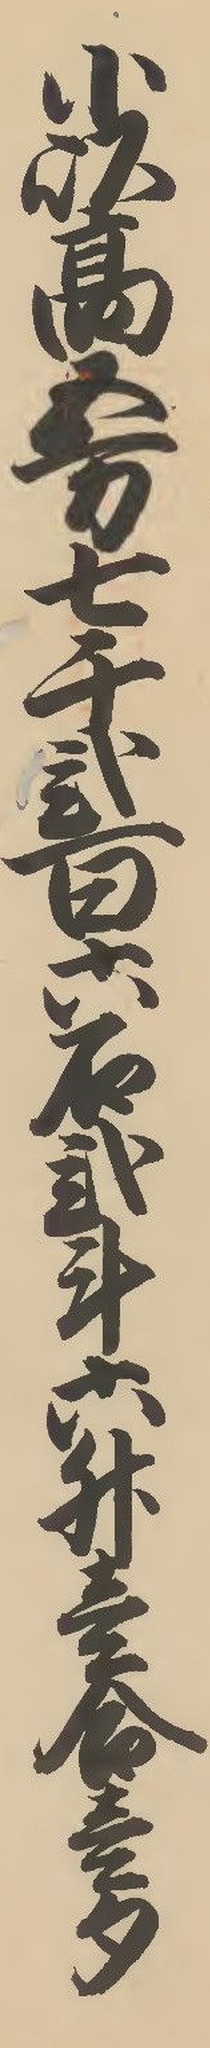小以髙五万七千弐百六石弐斗六升壱合壱夕
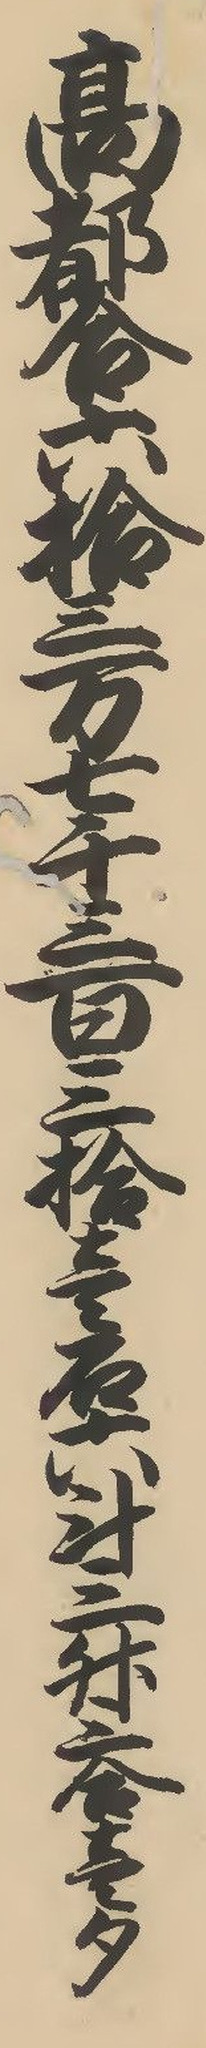髙都合六拾三万七千三百三拾壱石六斗三升三合壱夕
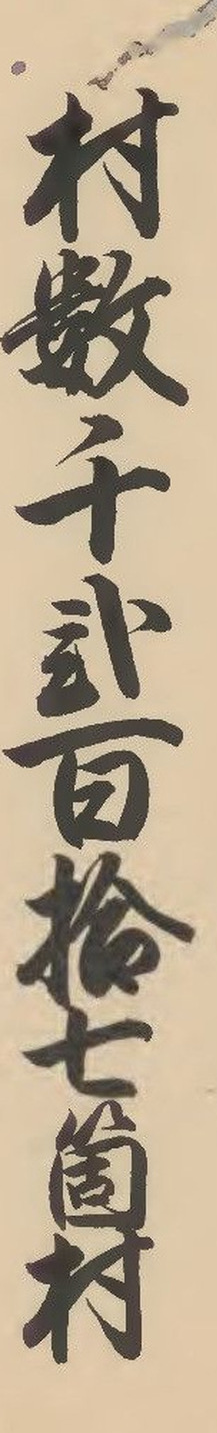村數千弐百拾七箇村
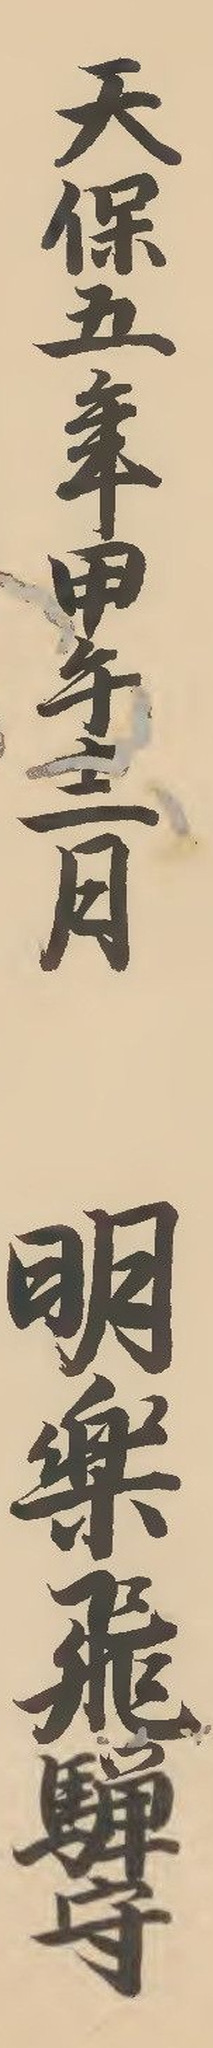天保五年甲午三月明樂飛騨守
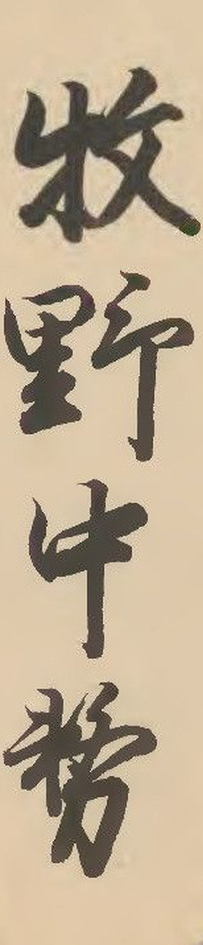牧野中務
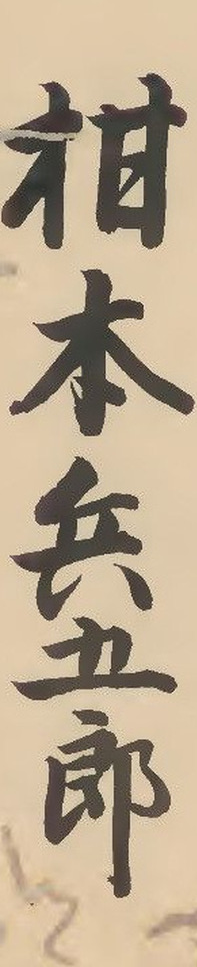柑本兵五郎
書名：上野国郷帳
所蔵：国立公文書館 National Archives of Japan
